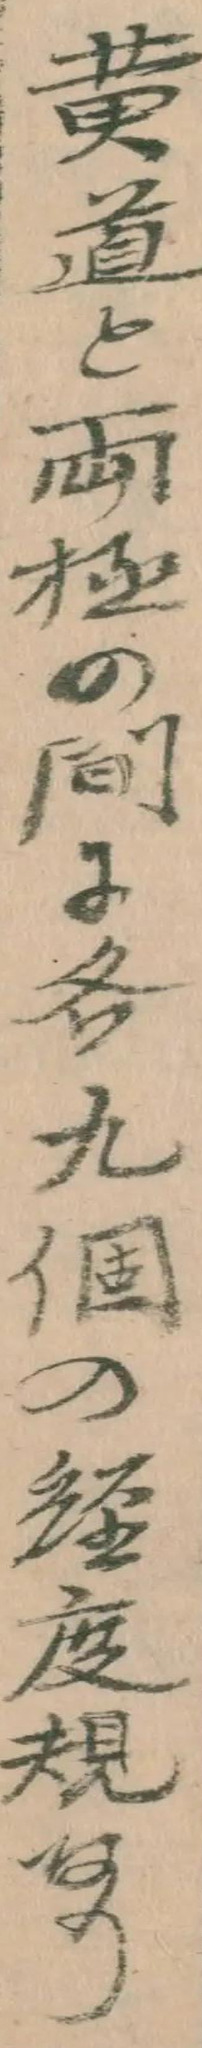黄道と両極の間に各九個の経度規あり
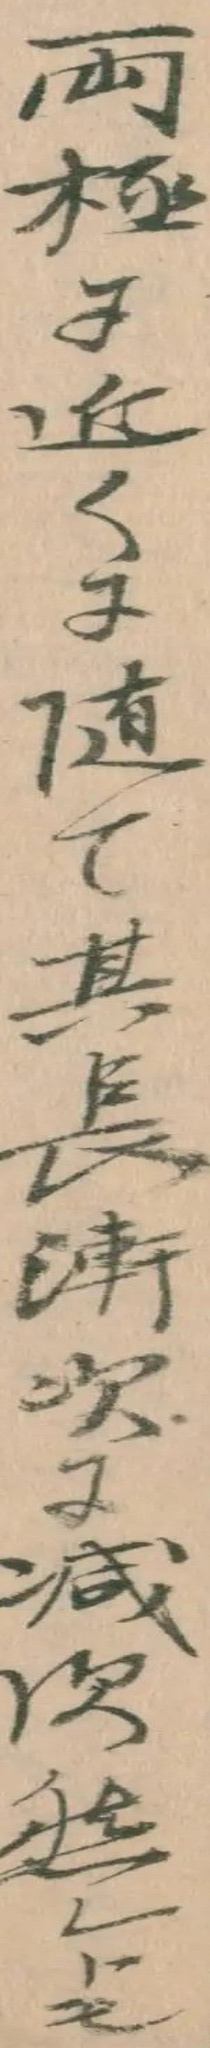両極に近くに随て其長漸次に減す然レトモ
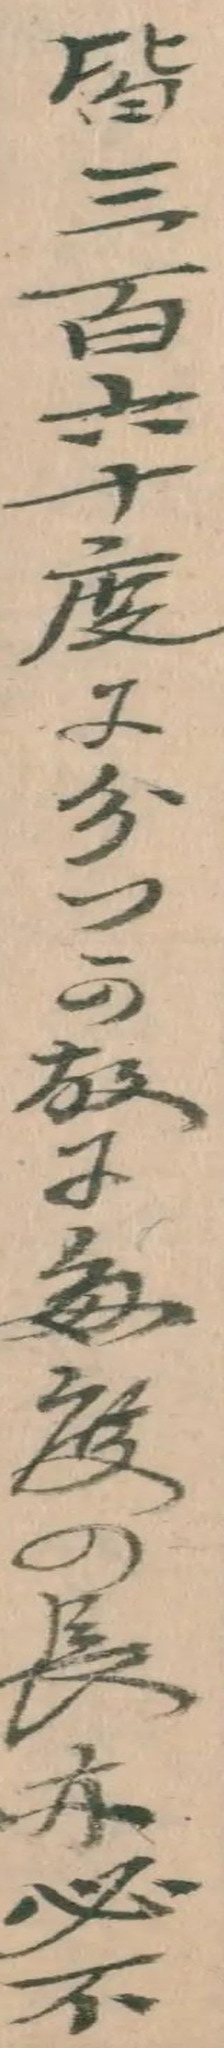皆三百六十度に分つか故に毎度の長亦必不
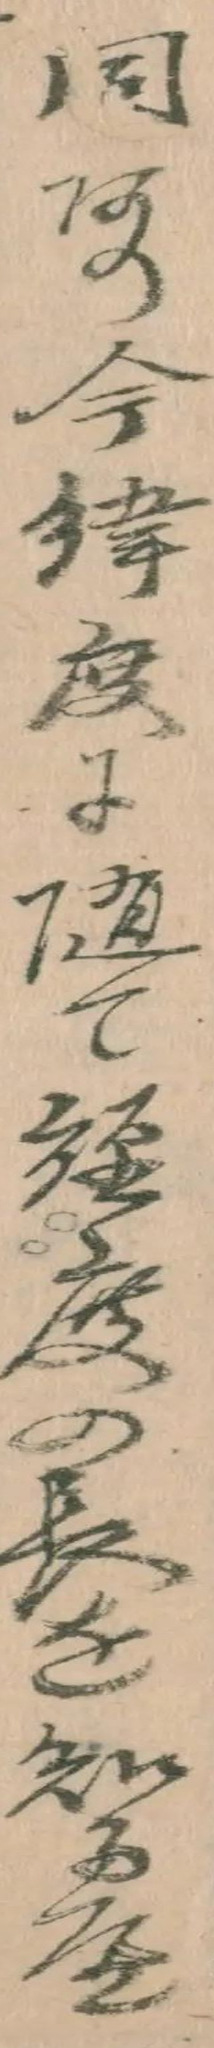同なり今緯度に随て経度の長を知るへ
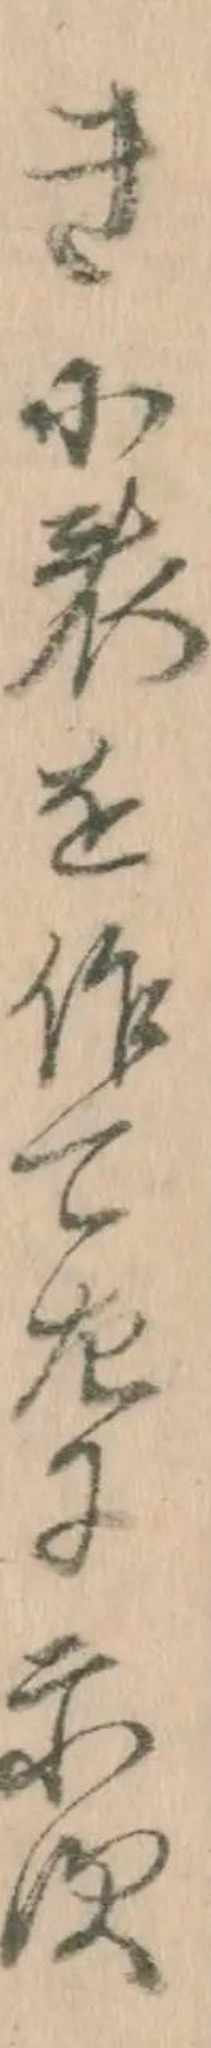き小表を作て左に示す
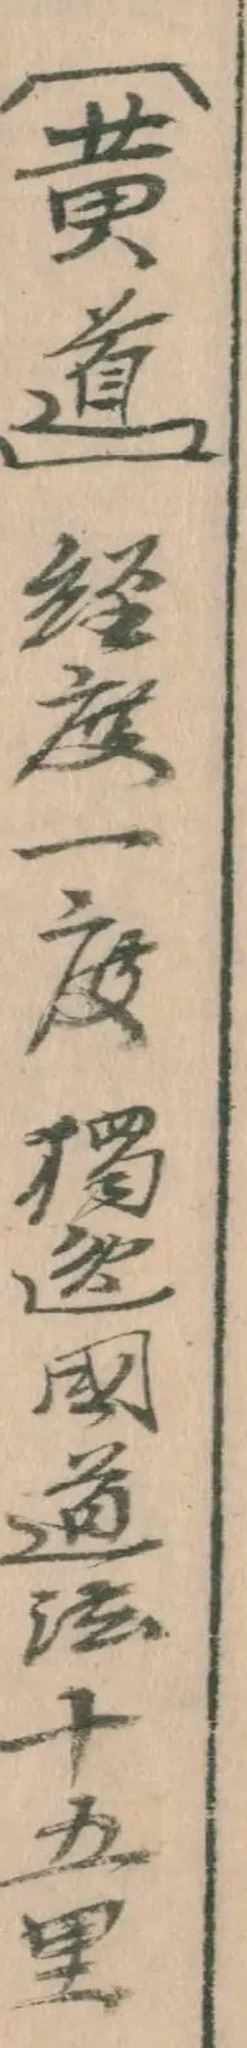(黄道)経度一度独逸国道法十五里
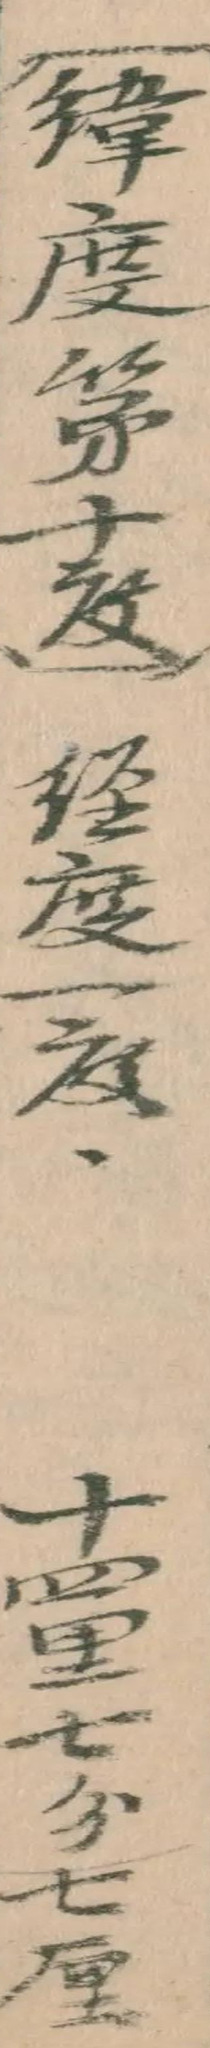(緯度第十度)経度一度十四里七分七厘

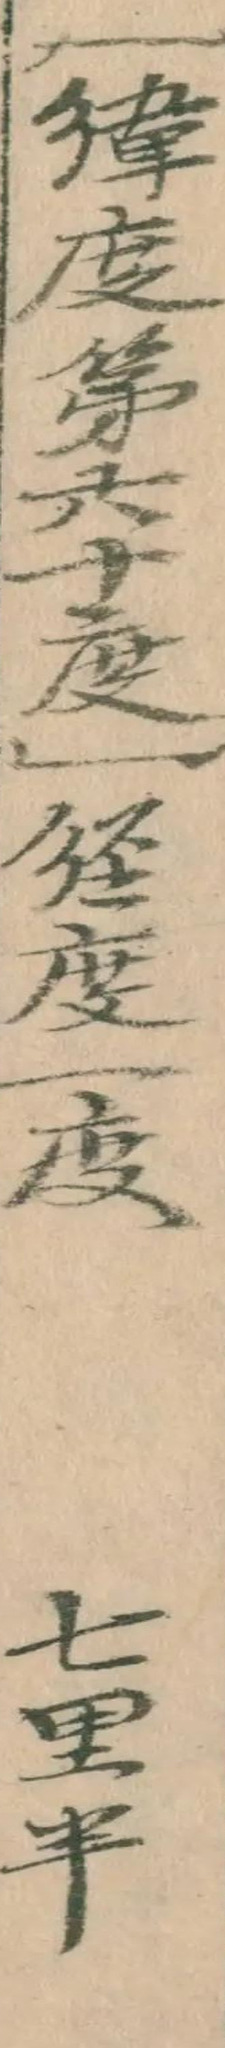(緯度第六十度)経度一度七里半
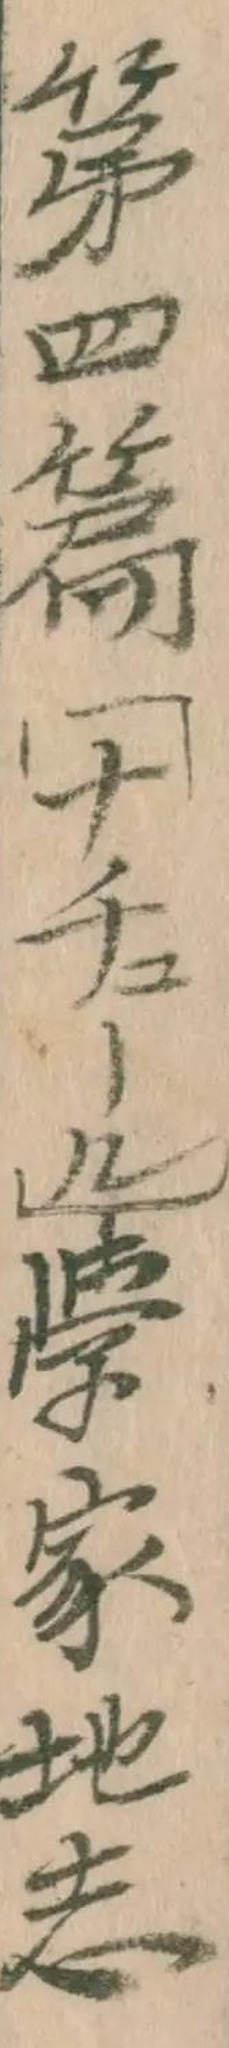第四篇(ナチュール)学家地志
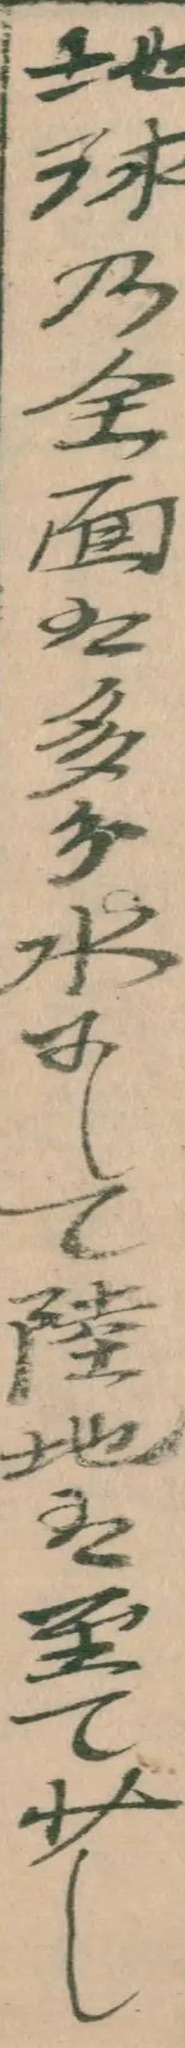地球の全面は多分水にして陸地は至て少し
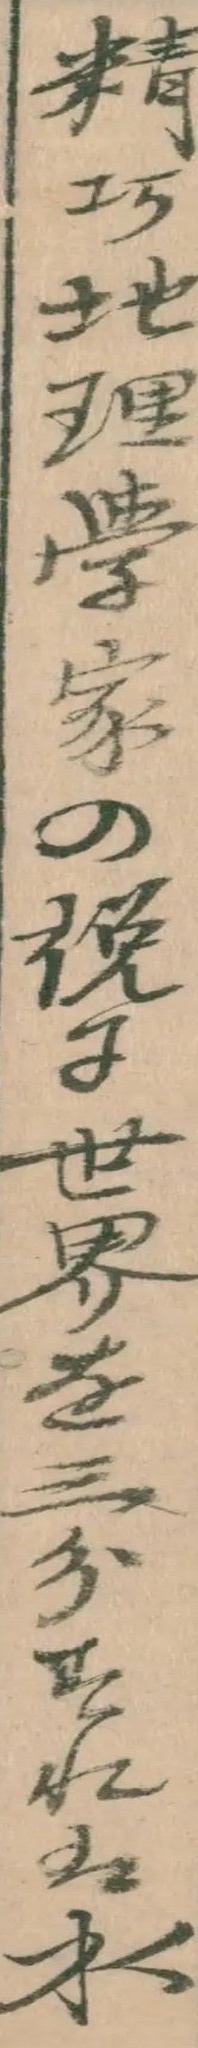精巧地理学家の説に世界を三分すれは水
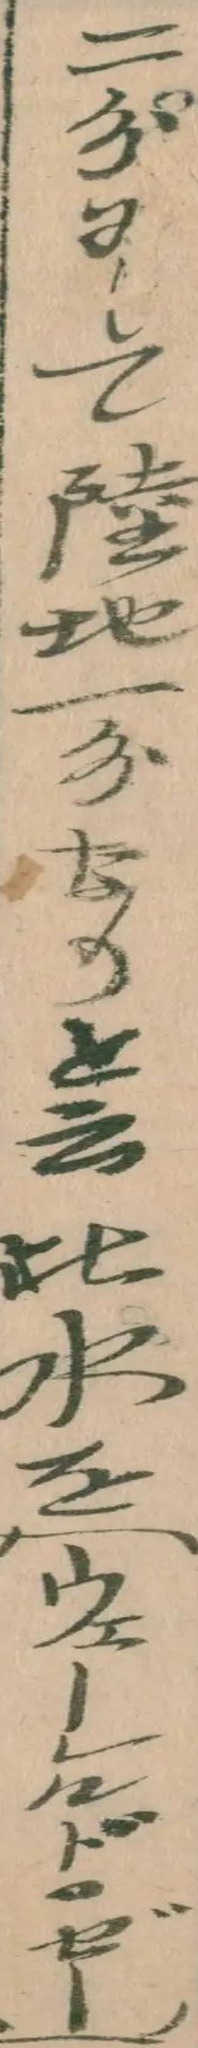二分にして陸地一分なりと云此水を(ウェーレルド・ゼー)
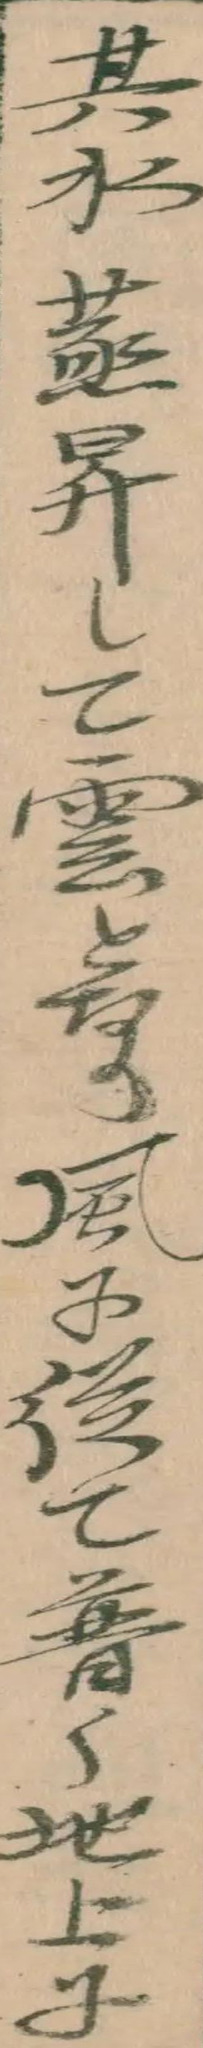其水蒸昇して雲となり風に従て普く地上に
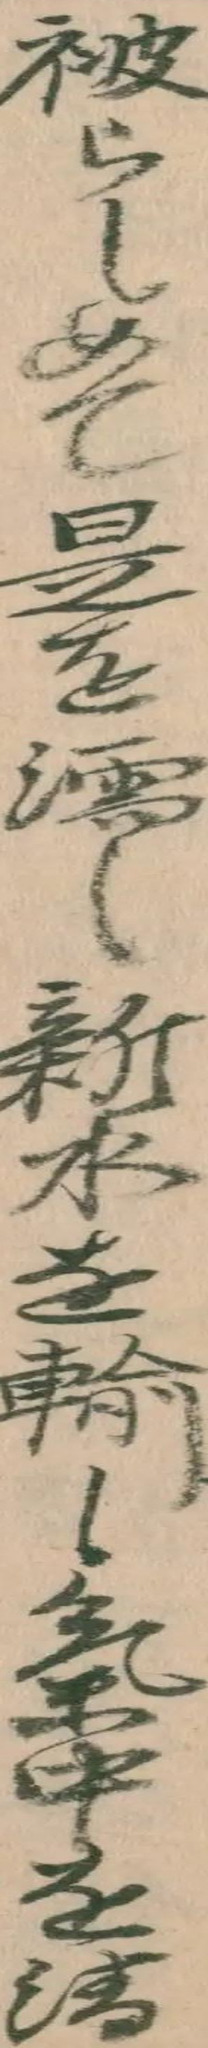被らしめて是を濡し新水を輸し気中を清
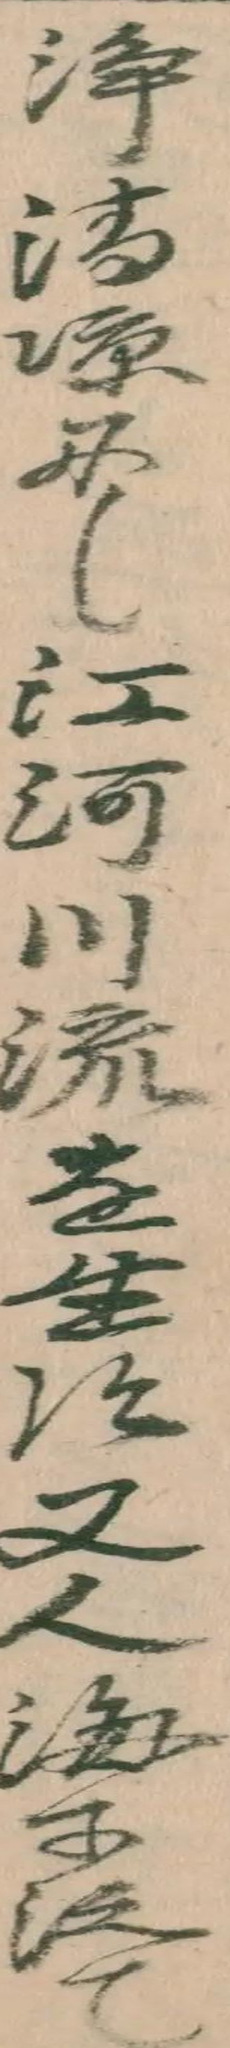浄清涼にし江河川流を生す又人海に泛て
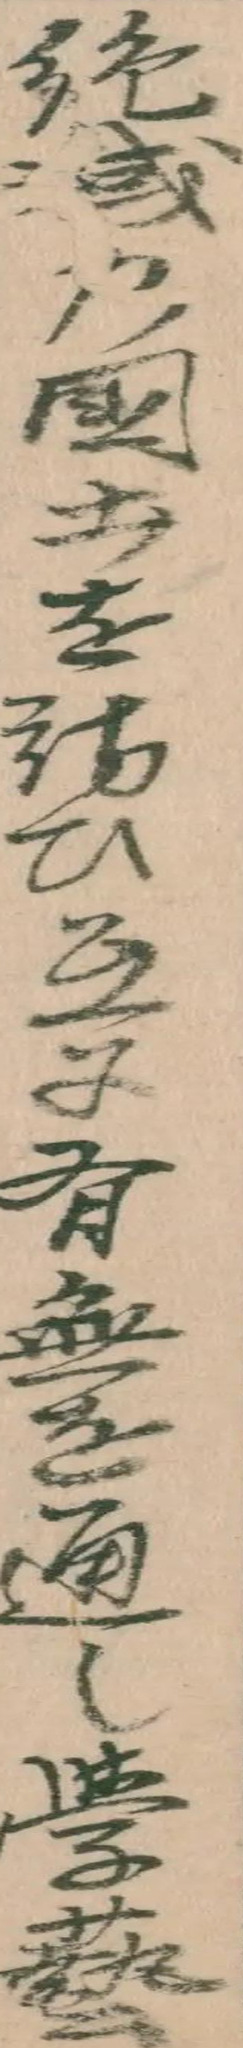絶域の国土を訪ひ互に有無を通し学芸
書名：新釈輿地図説
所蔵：国立国会図書館 National Diet Library, JAPAN
